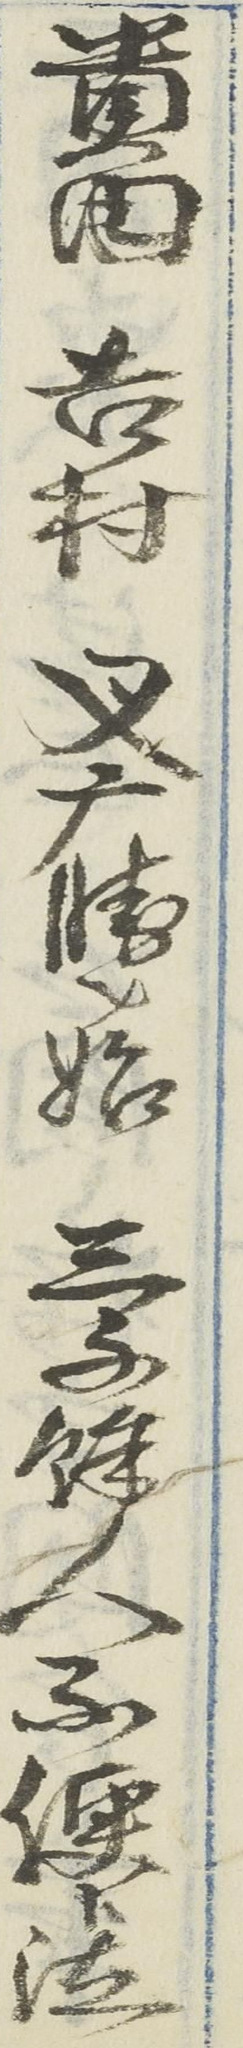貴田吉村又广勝ヲ始三千餘人不便ト泣
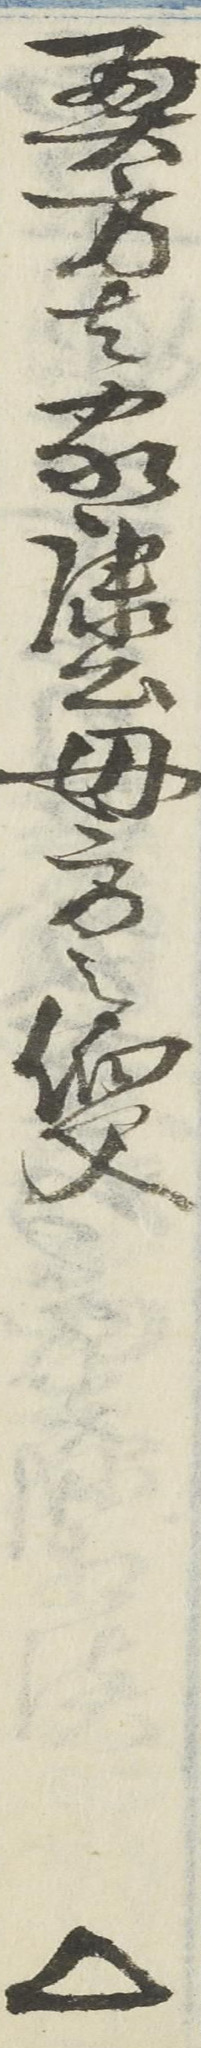奥方は家康公母方之伯父△
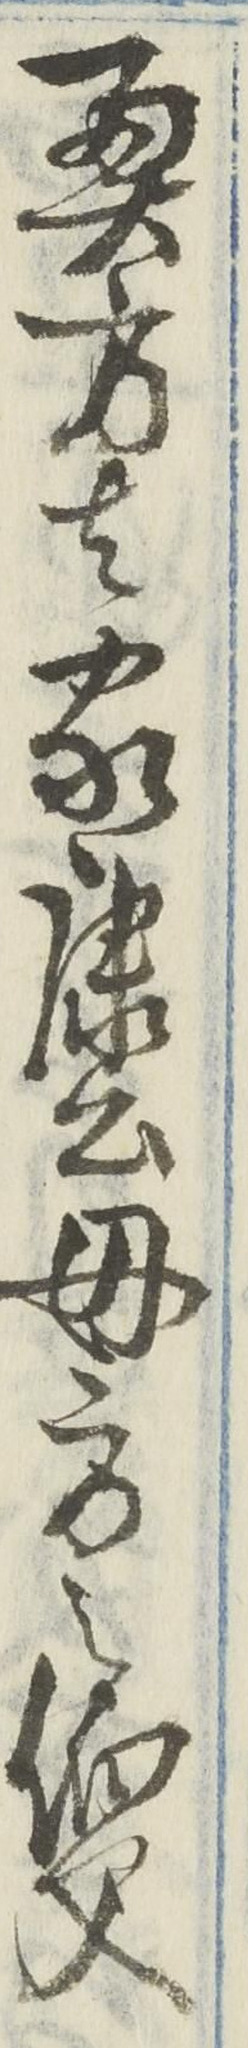奥方は家康公母方之伯父△
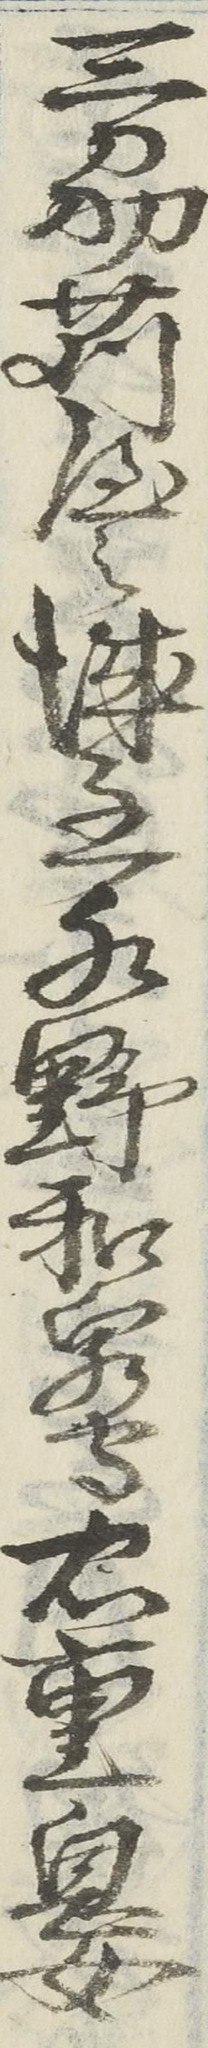三州苅屋之城主水野和泉守忠重息女
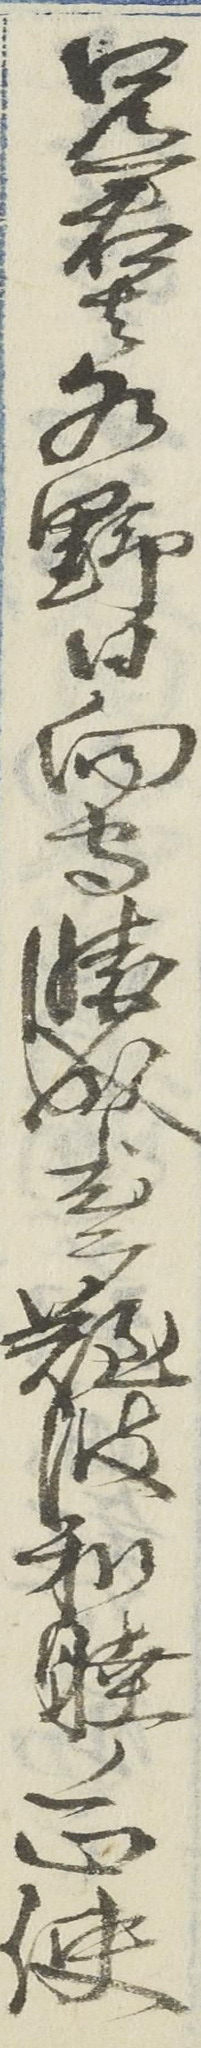兄君は水野日向守勝成ト云テ難波和睦ノ正使
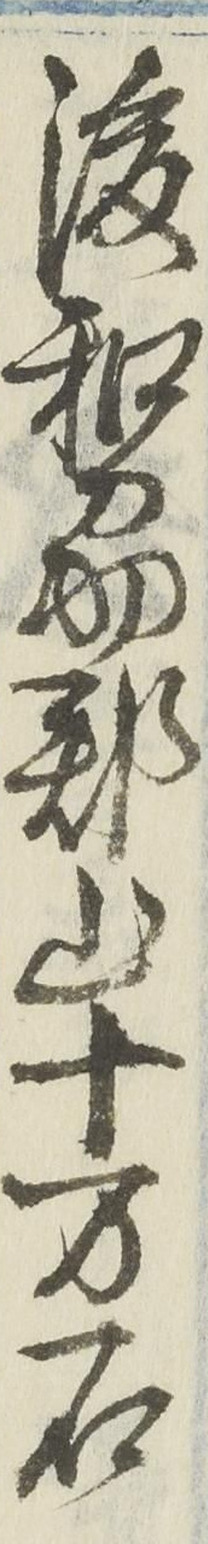後和州郡山十万石
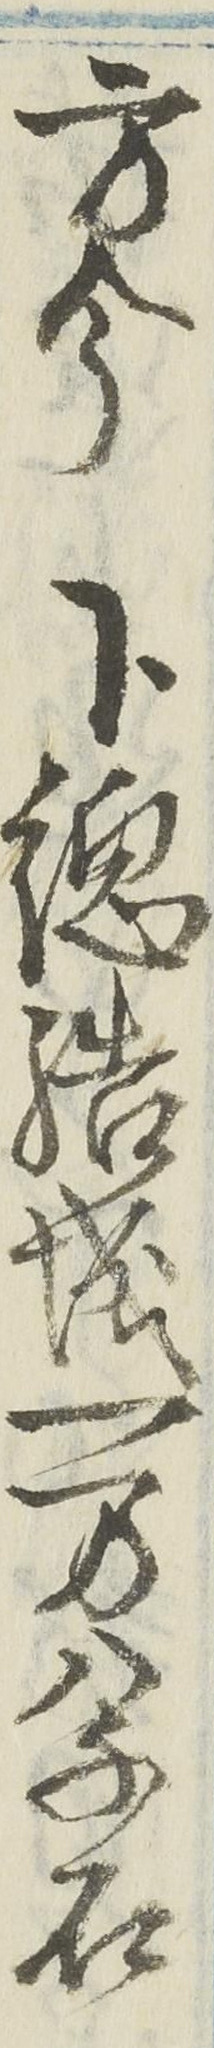方今下総結城一万八千石
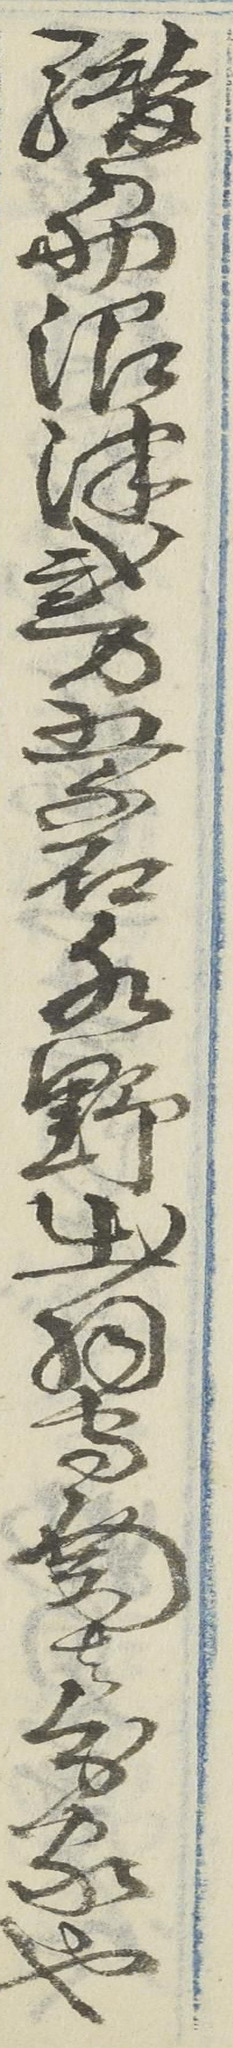駿州沼津弐万五千石水野出羽守殿は分家也
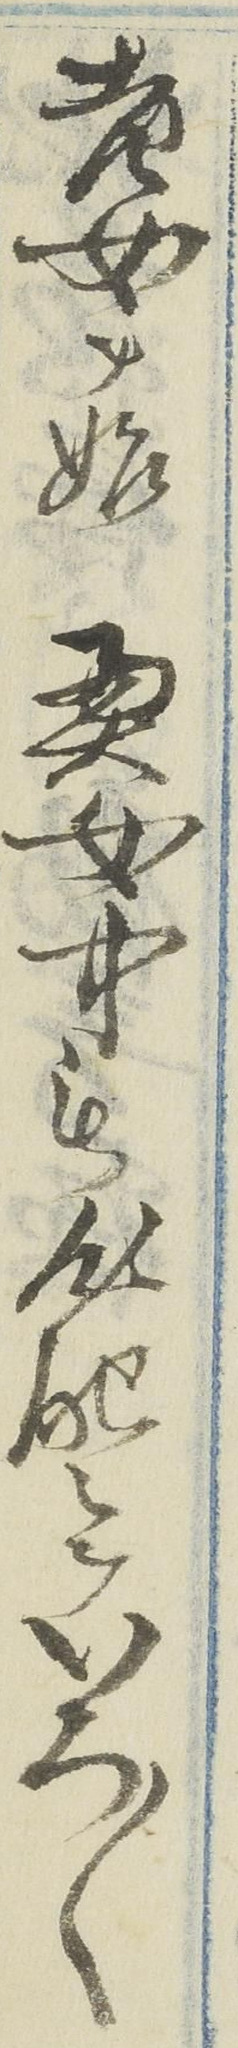老女ヲ始奥女中も心配ニていろ〳〵

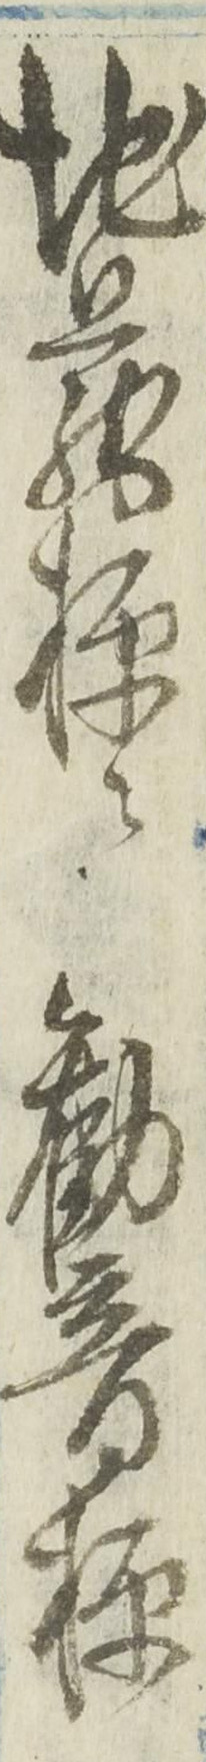地蔵様ニ勧音様
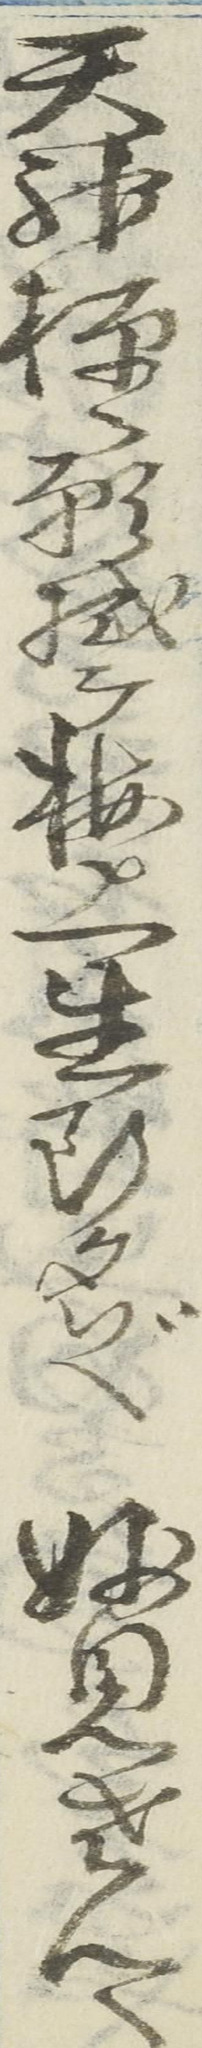天神様へ願掛テ梅ヲ一生断タゾへ妙見さんへ
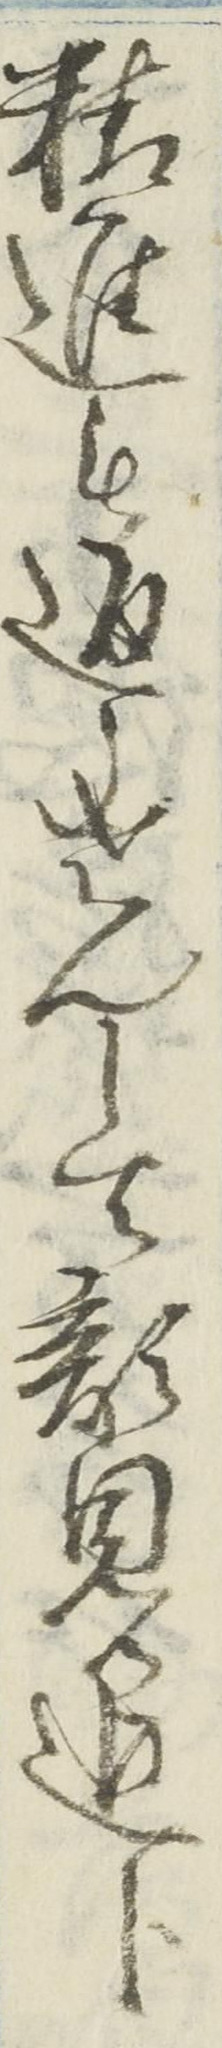精進も返さんして顔見ル迄ト
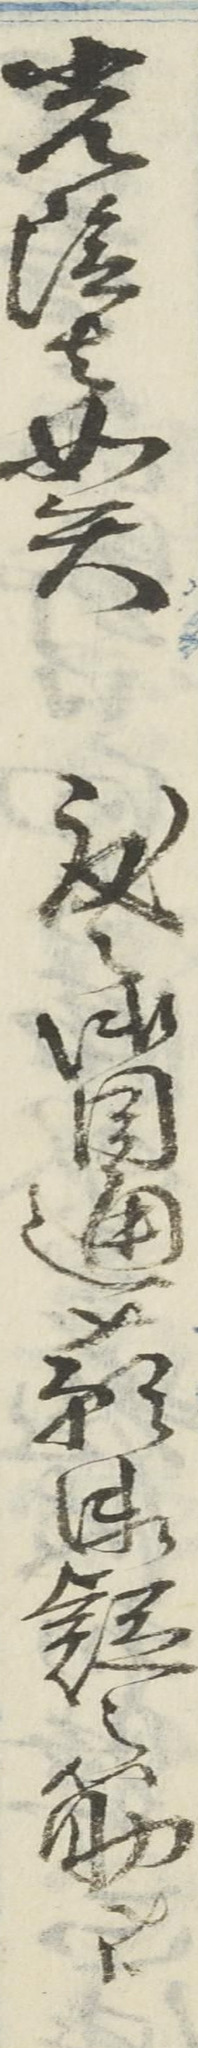光陰は如矢度々御目通ヲ願御疑之筋ヲト
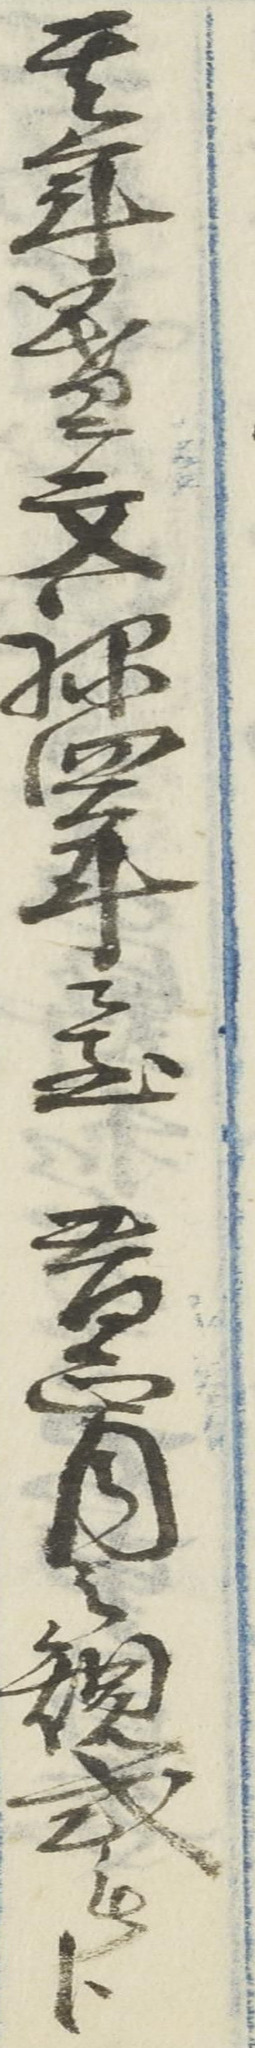其年暮テ文禄四年ニ至昔正月之規式モト
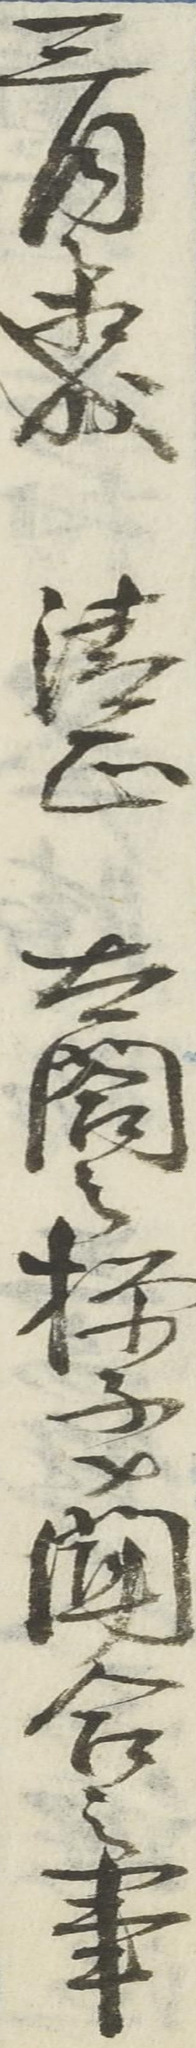三月ニ相成清正太閤之様子ヲ聞合之事
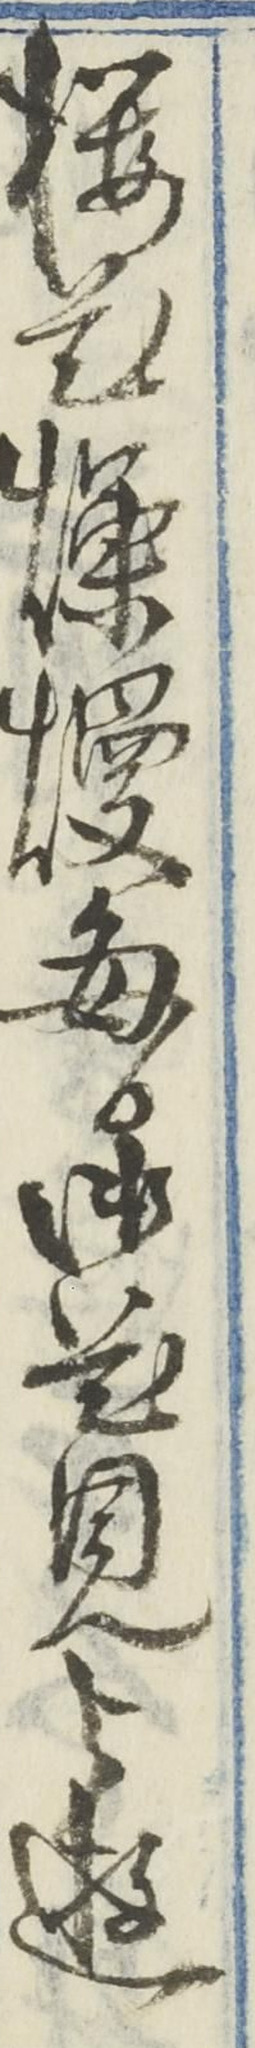桜花爛漫毎日御花見被遊
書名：伏水大地震
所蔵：東京大学地震研究所図書室 Earthquake Research Institute Library, The University of Tokyo, JAPAN
